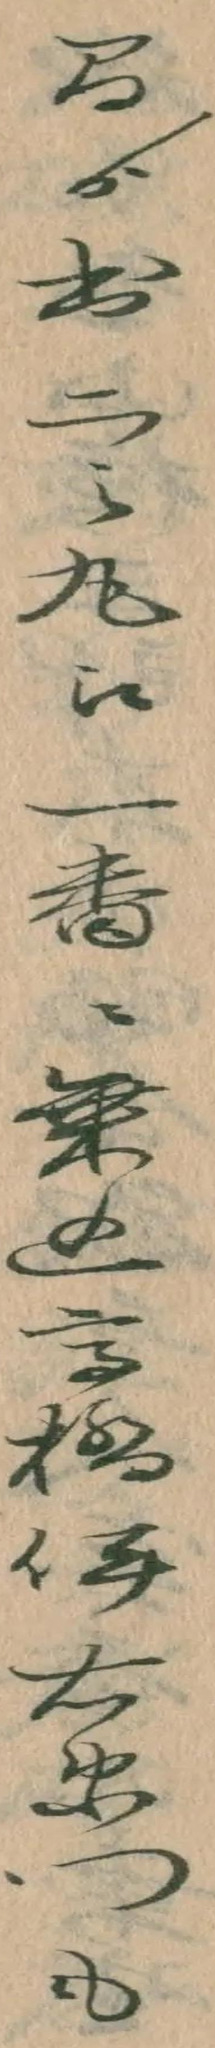間ゟ出二之丸江一番に乗込高橋伊右衛門も
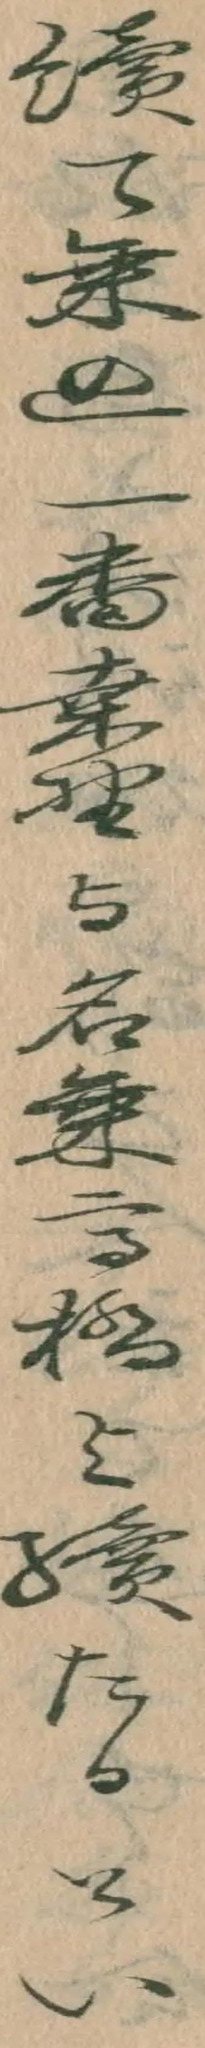続て乗込一番桑野与名乗高橋と続たるとい
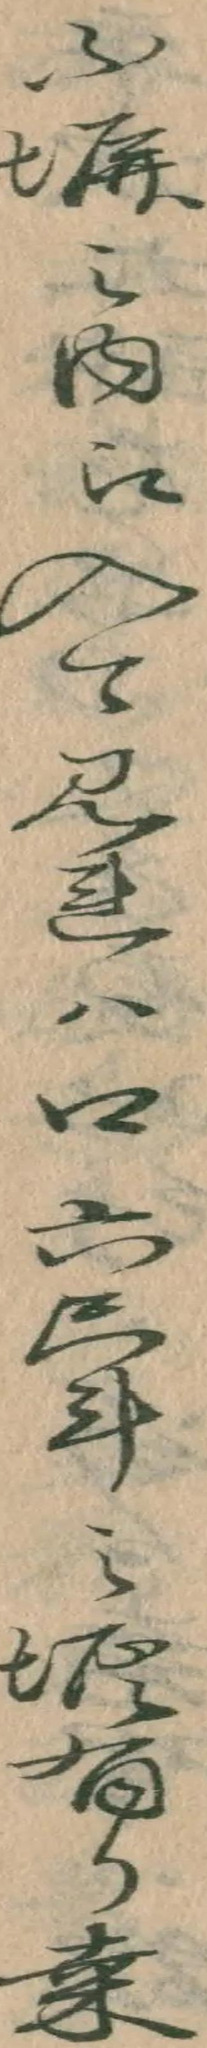ふ塀之内江入て見連は口六尺斗之塀有り桑
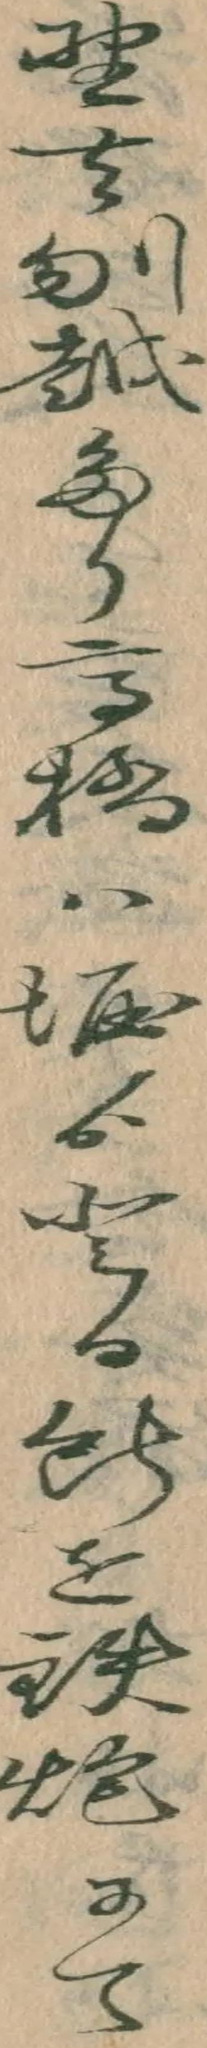野其刎越多り高橋は塀ゟ登る所を鉄砲尓て
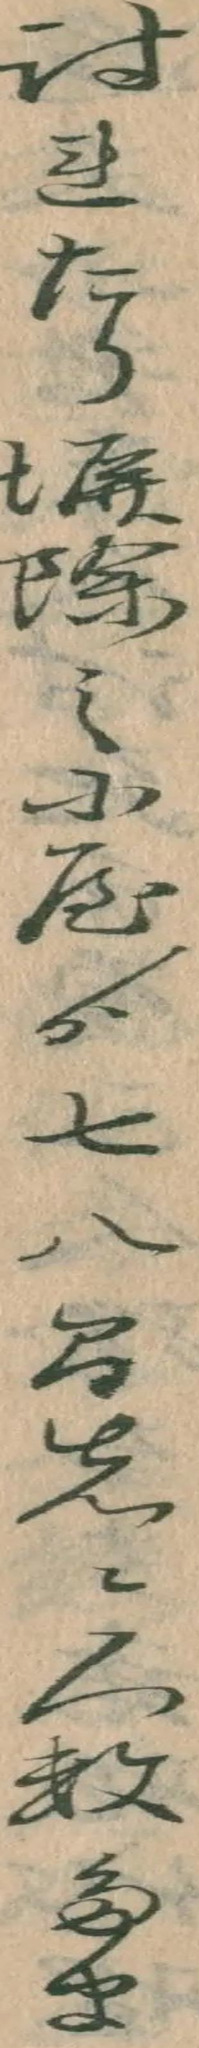討連たり塀除之小屋ゟ七八間先に人数多ま
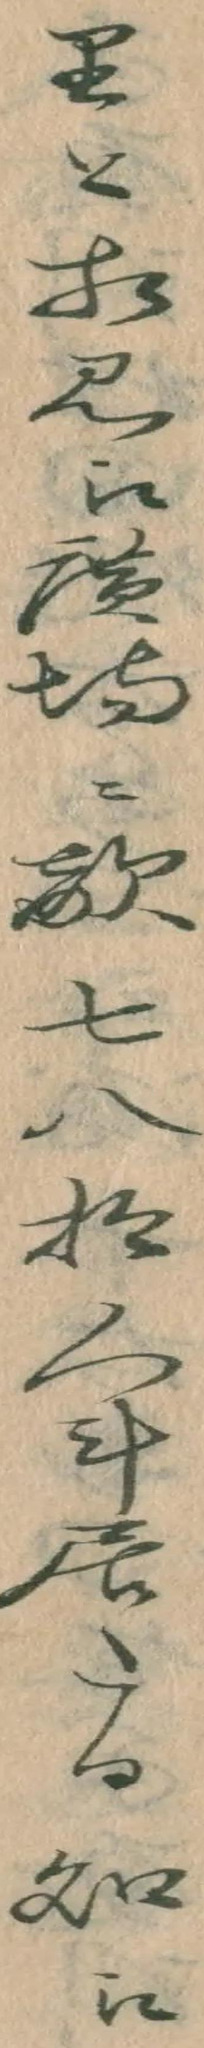里と相見江広場に敵七八拾人斗居たる処江
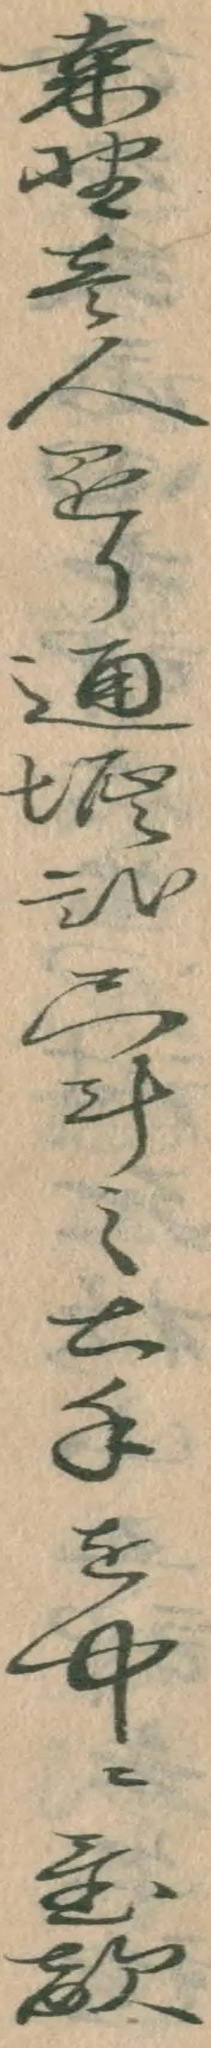桑野壱人懸り通塀弐尺斗之土手を中に置敵
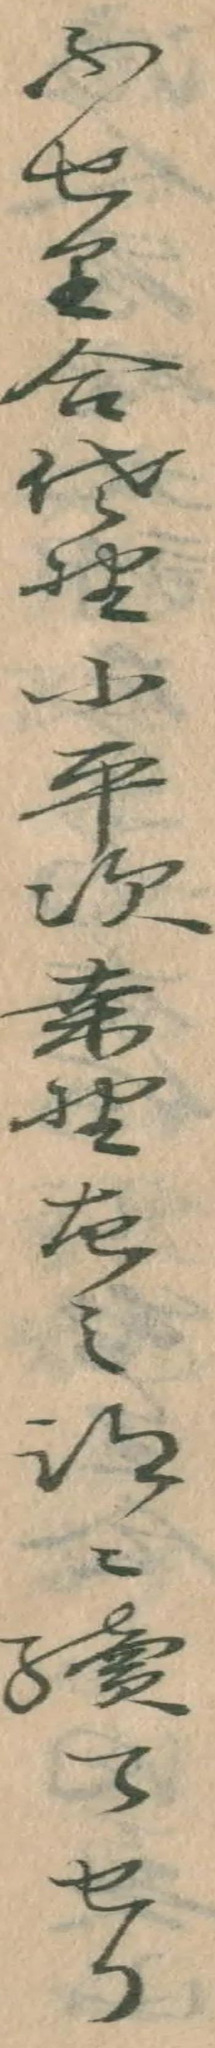ふせ里合佐野小平次桑野左之跡に続てせり
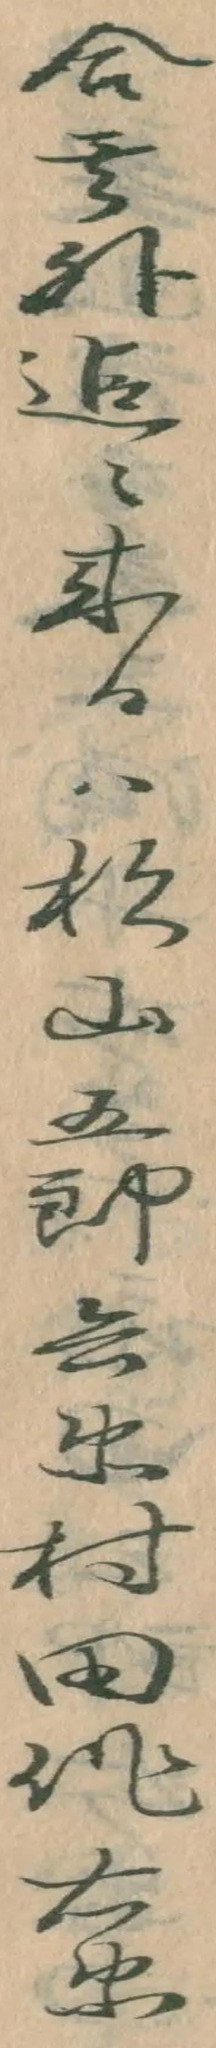合其外迄に来るは杉山五郎兵衛村田作右衛

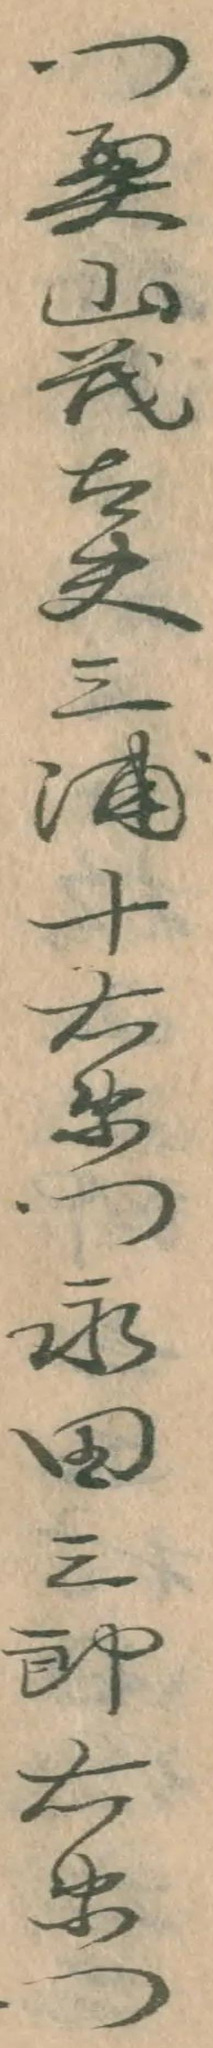門奥山茂太夫三浦十右衛門永田三郎右衛門
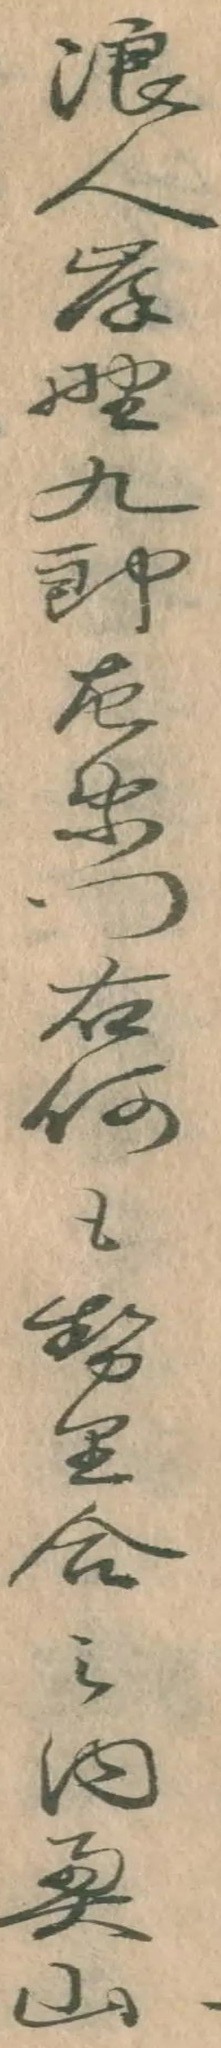浪人岸野九郎左衛門右何も勢里合之内奥山
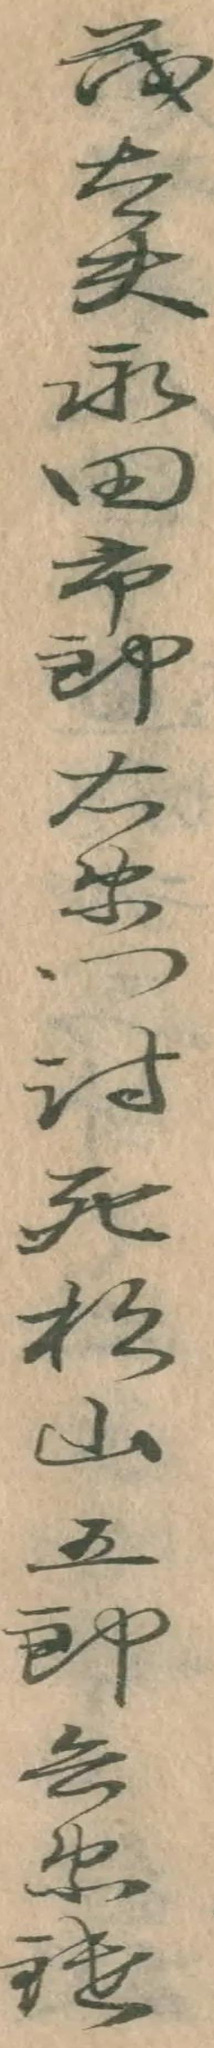茂太夫永田市郎右衛門討死杉山五郎兵衛鑓
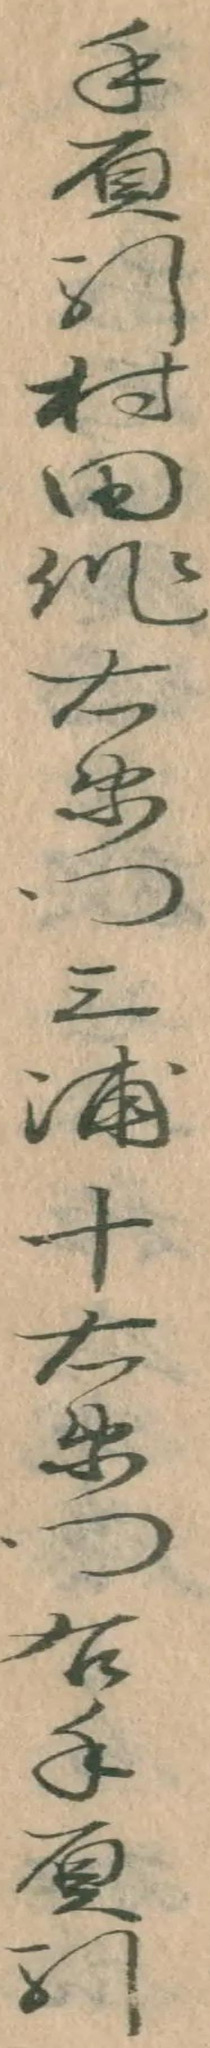手負引村田作右衛門三浦十右衛門右手負引
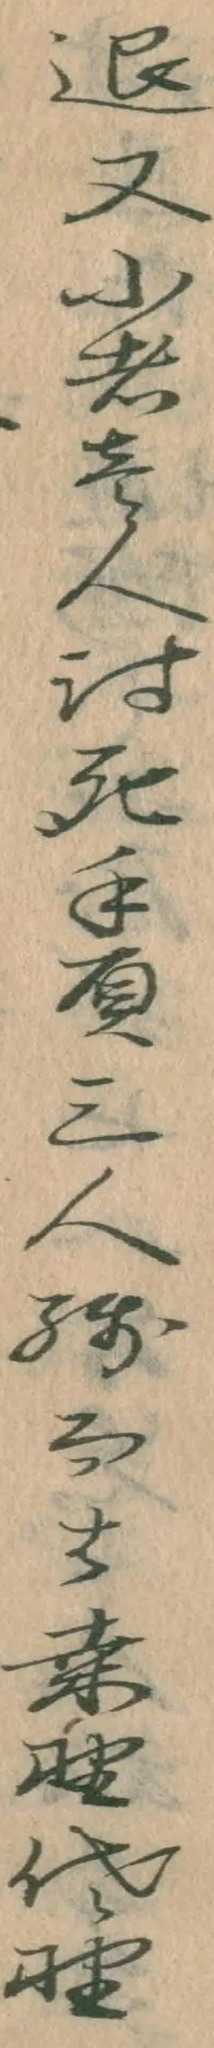退又小者壱人討死手負三人残而者桑野佐野
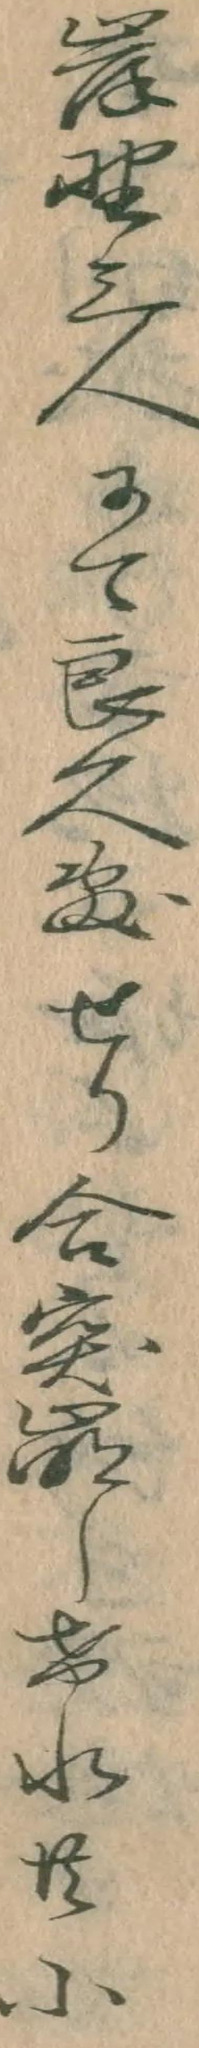岸野三人尓て良久敷せり合突崩し希れ共小
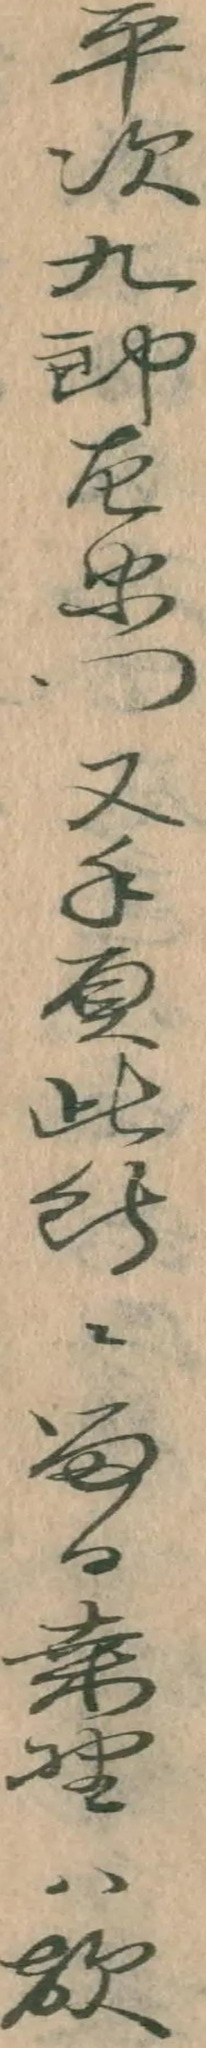平次九郎左衛門又手負此所に留る桑野は敵
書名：切支丹御退治記 49巻. [8]
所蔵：国立国会図書館 National Diet Library, JAPAN
